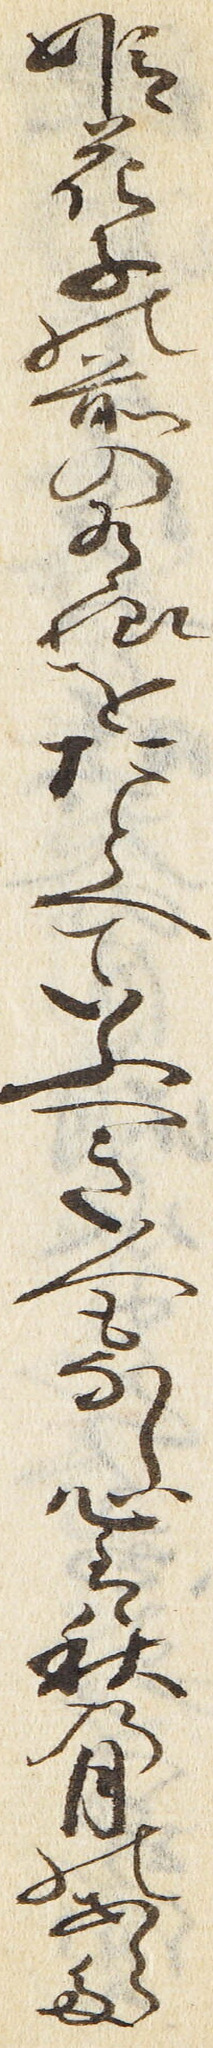姫花子の前の有様をたとへていふへき人もなし心は秋の月のあらた
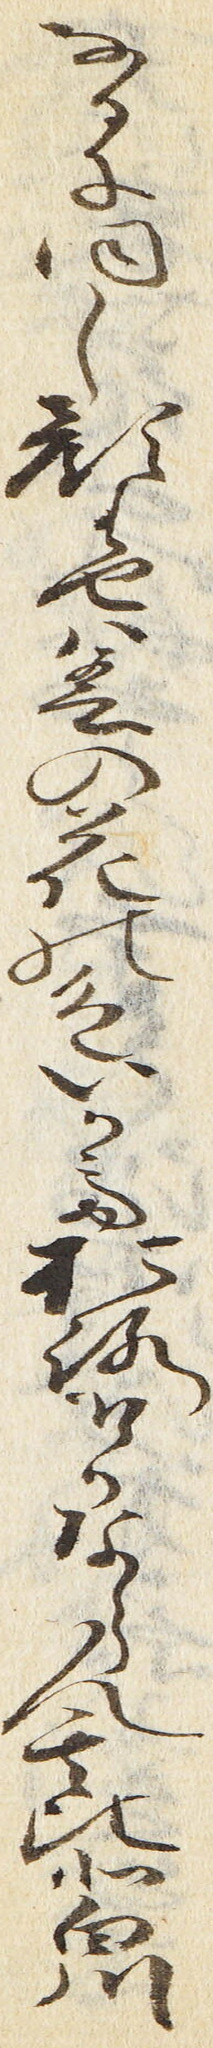なるに同し顔はせは春の花の色いかておろそかならん其比北白川
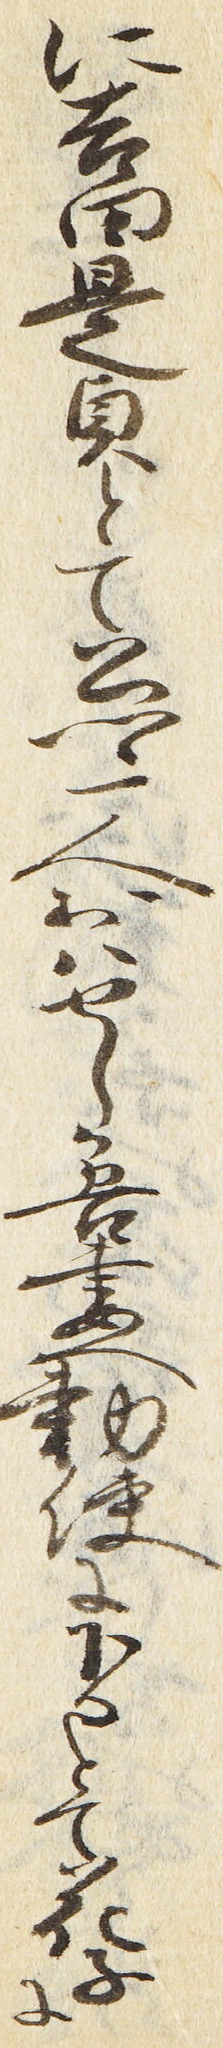に吉田是貞とて公卿一人おはせしか吾妻へ勅使に下るとて花子に
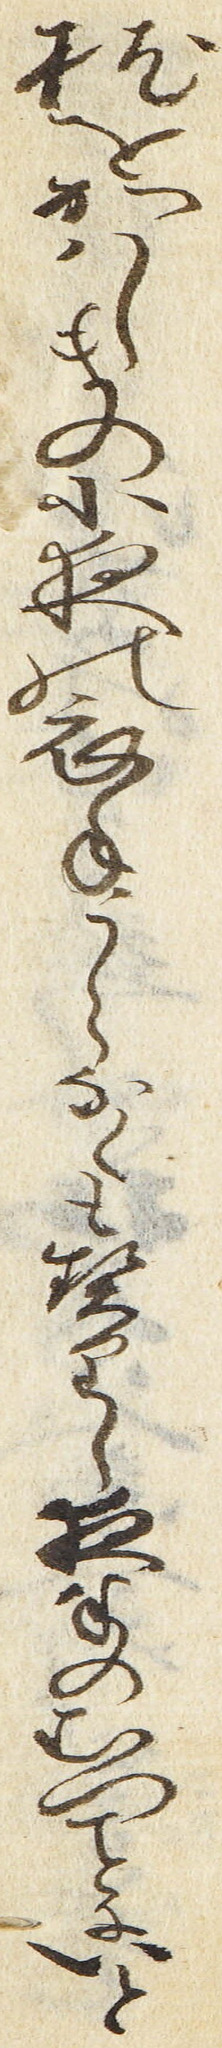枕をかはしまの小夜の衣手うらなくも契りし夜半のむつことにいと
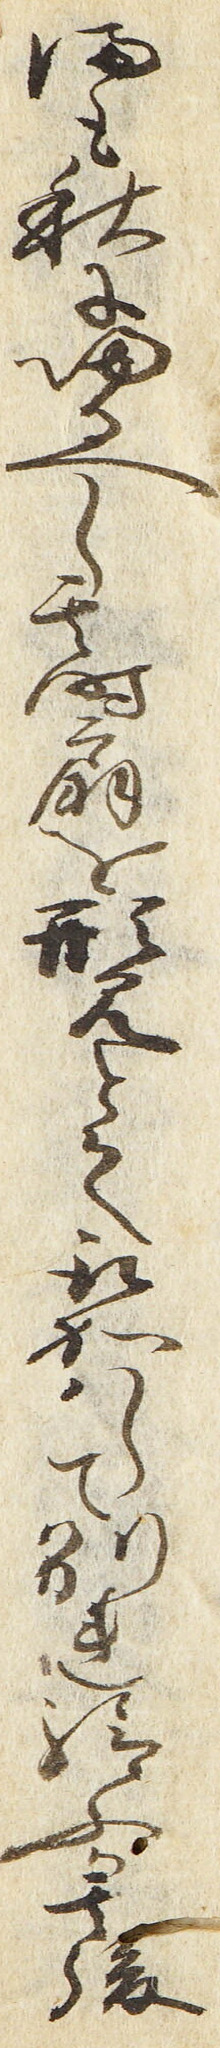まも秋に帰るへし其時扇を形見とて取かはして別れ給ふか其後

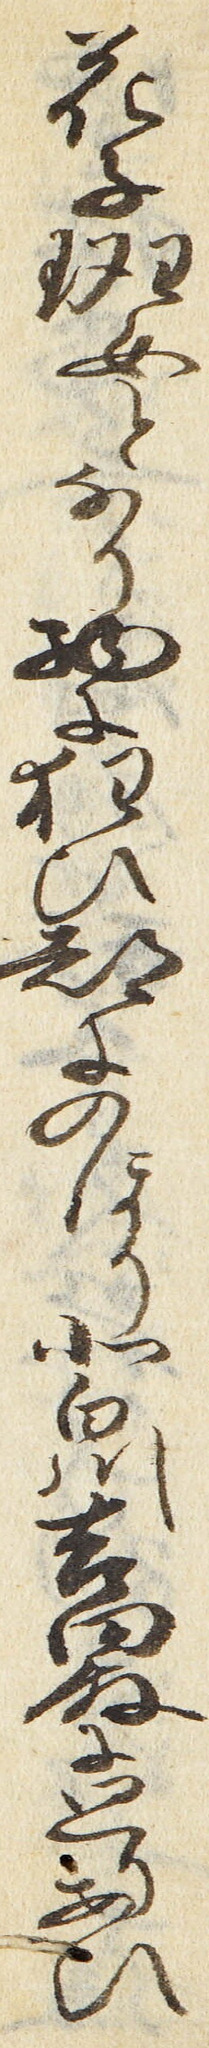花子班女となり物に狂ひ都にのほり北白川吉田殿に廻りあひ
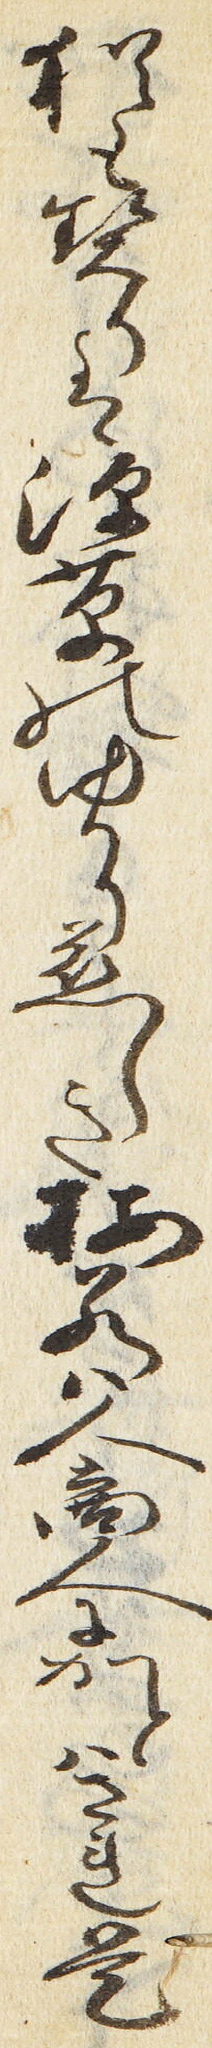猶も契りは深草のゆかり恋しき梅若は人商人にかとはされ是
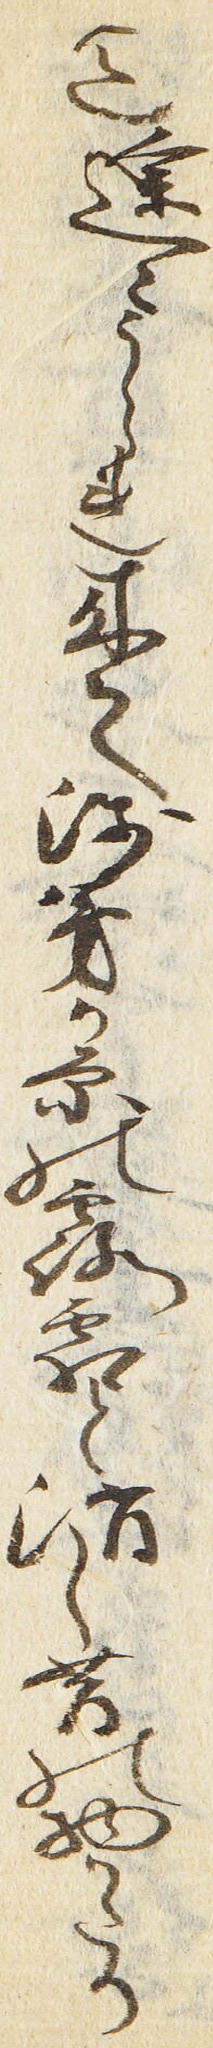迄途々うられ来て浅茅か原の露霜と消し昔の物かたり
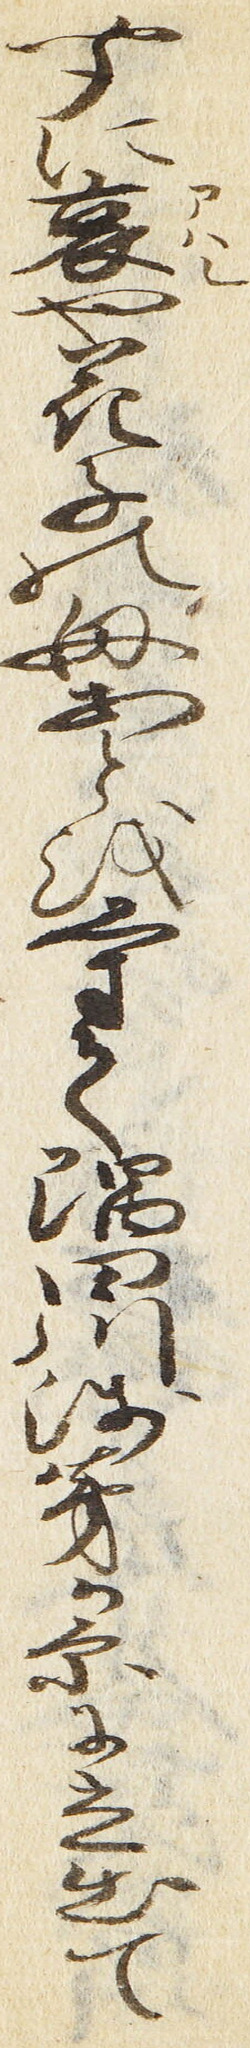聞に哀や花子の母あとを尋て隅田川浅茅か原に立出て
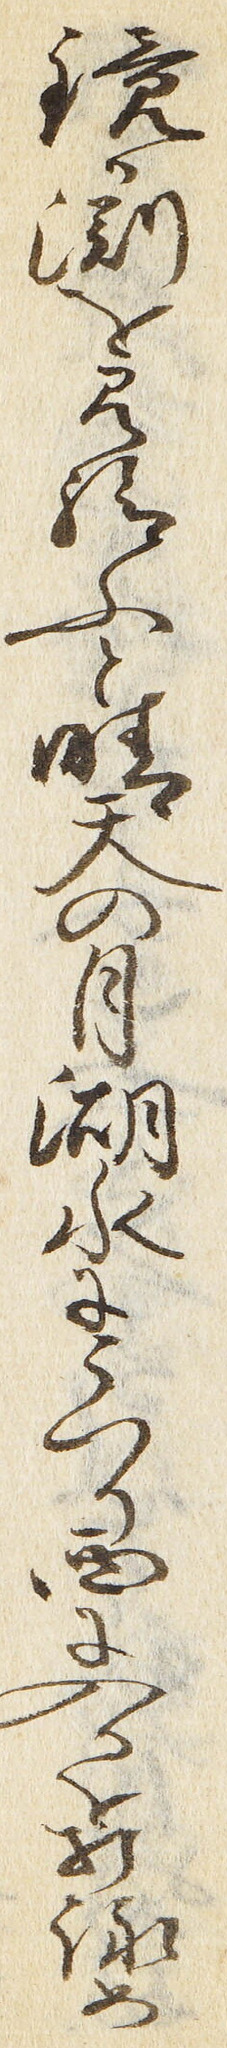鏡か渕を見給ふと晴天の月湖水にうつり西に入るを打詠め
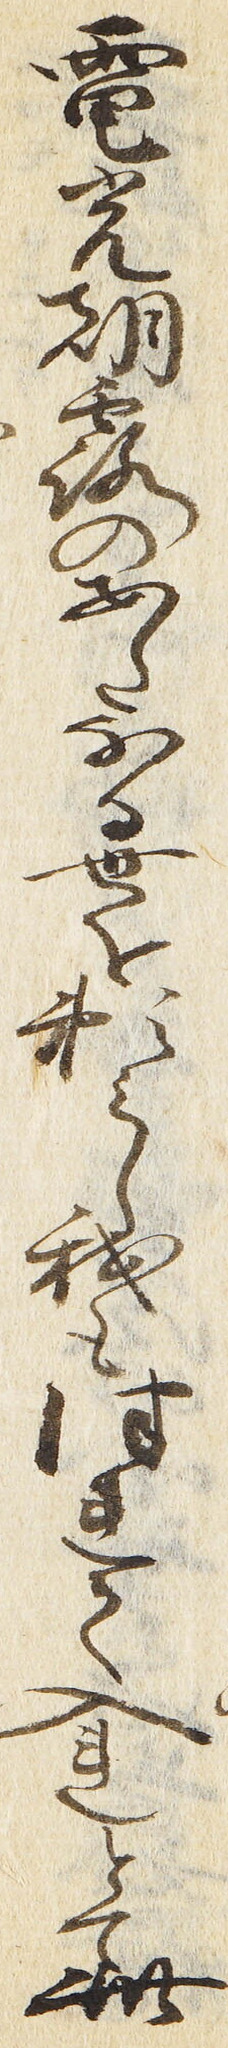電光朝露のあたなる世を頼みし我もつれて入れとて此
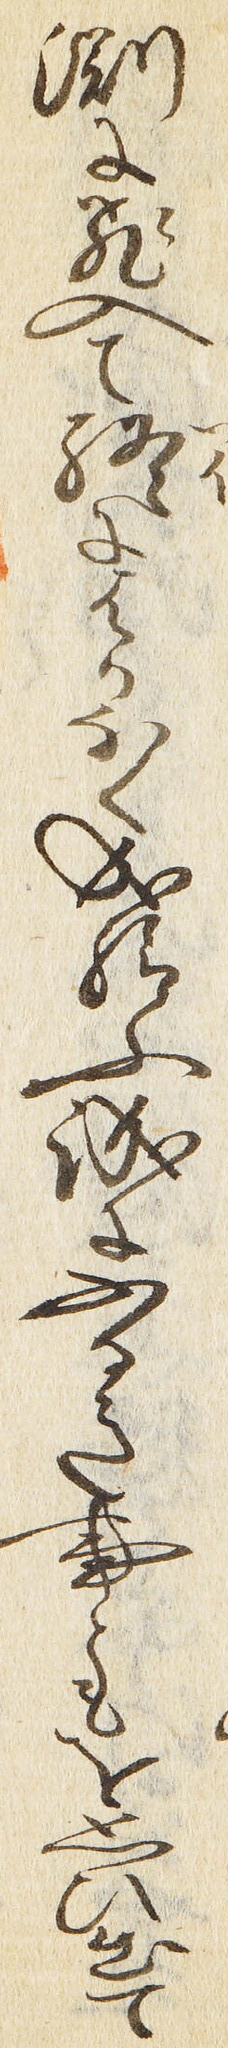渕に飛入て終にはかなく成給ふ誠にふるき事ともを思ひ出て
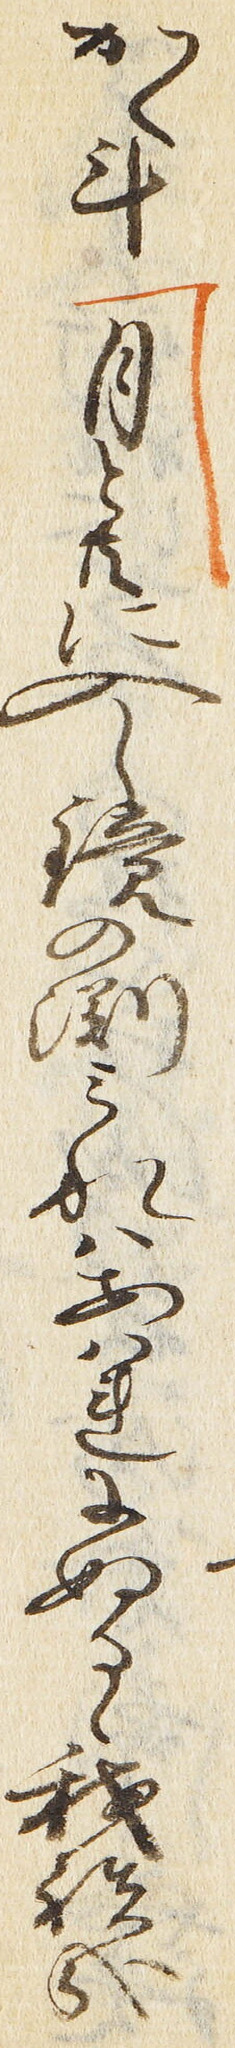かく斗「月と共に入し鏡の渕みれはあはれにぬるゝ我結哉
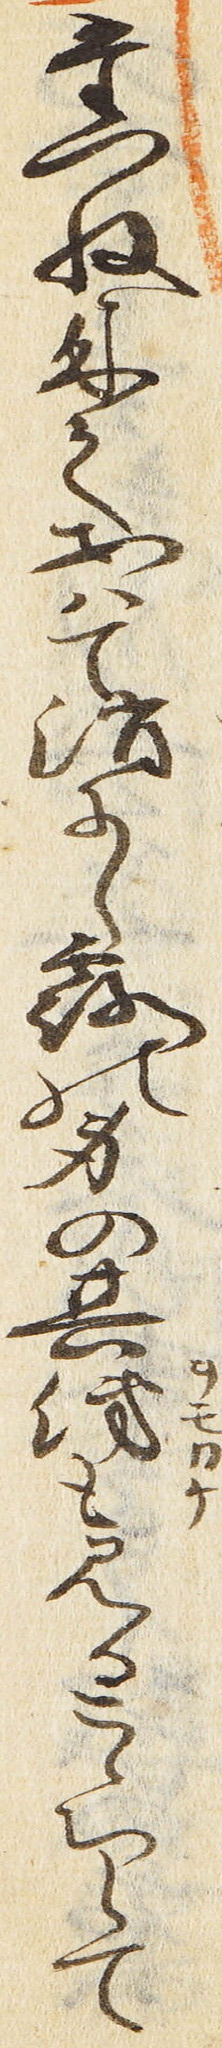「たつね来てあはて消にし露の身の其俤も見るこゝちして
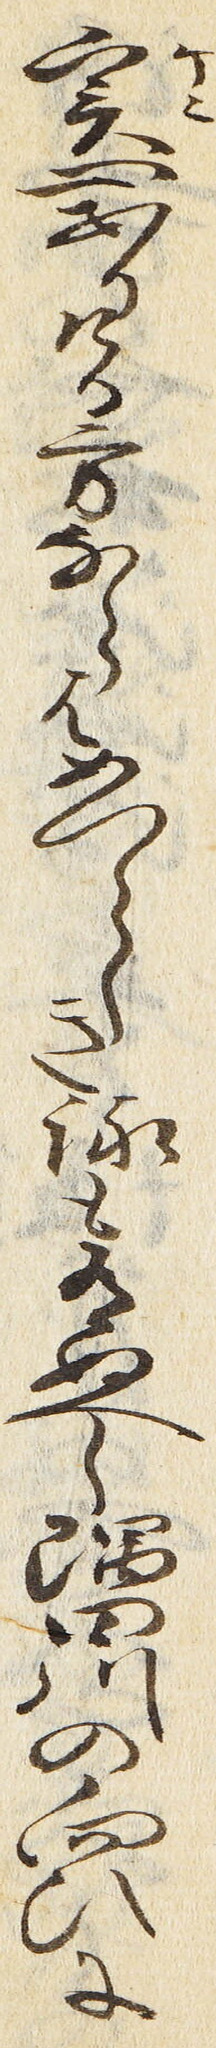実参りける方ならはめつらしき詠も有ぬへし隅田川の向ひに
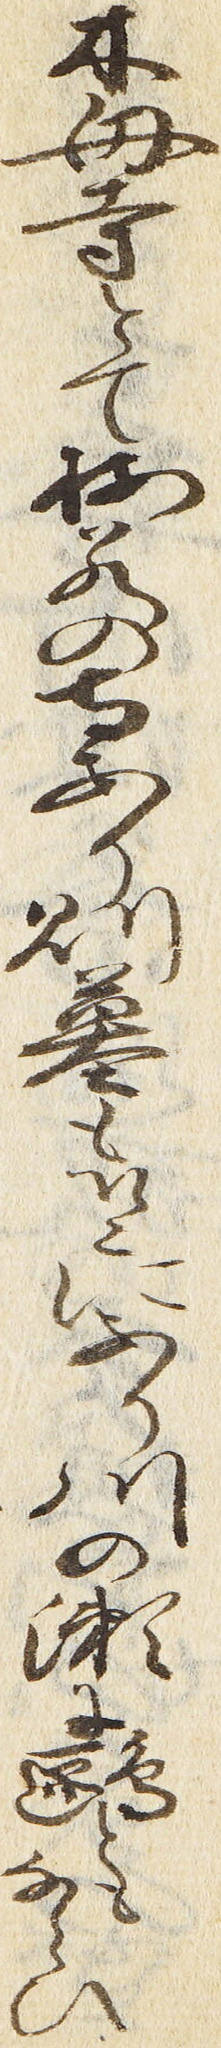木母寺とて梅若の寺あり則墓もそこにあり川の瀬に鷗ともならひ
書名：海陸世話日記
